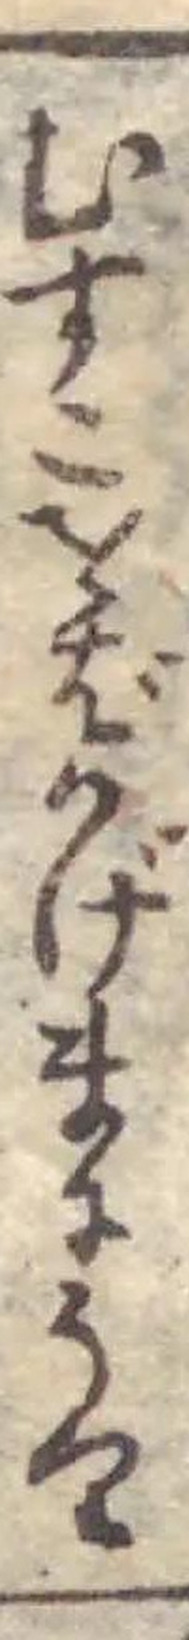むすこをばかげまにうり
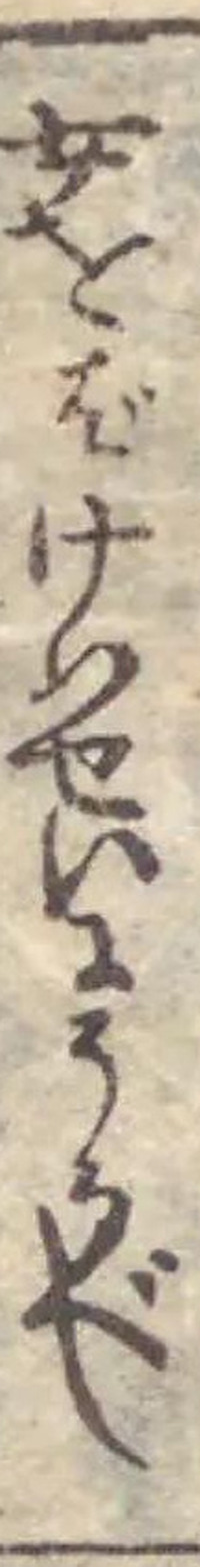女をばけいせいにうるべし
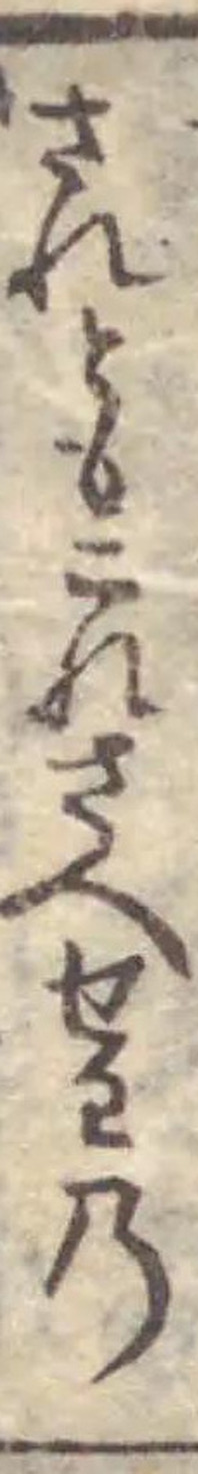されともこれさへせわの
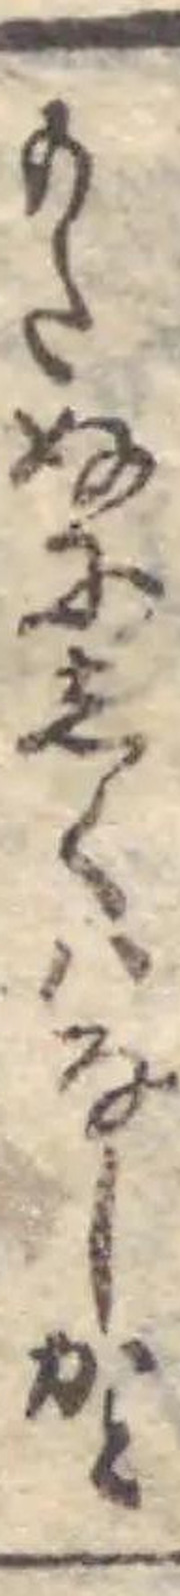もたぬにしくはなしかと
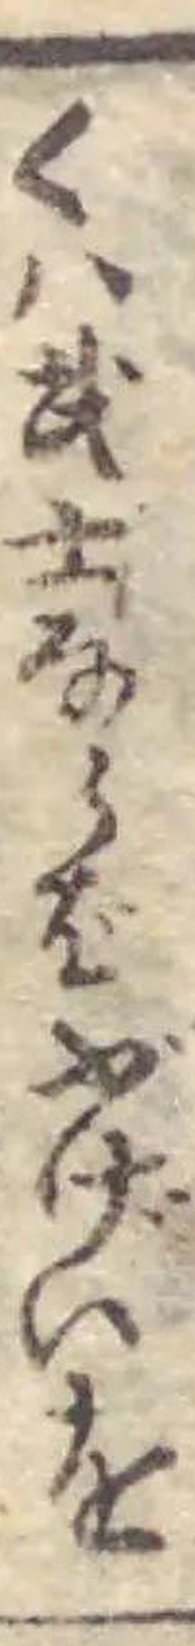くは武士ならばぶげいを
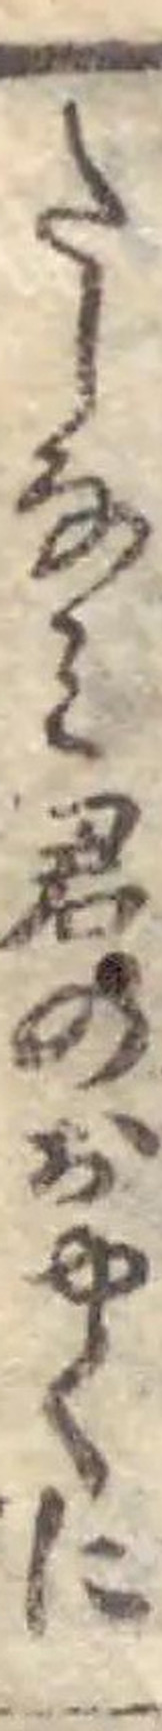たしなみ君のおやくに
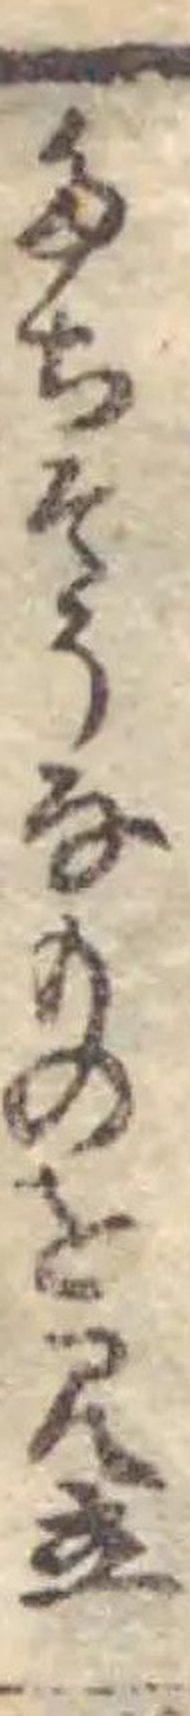たちそうなものを見立
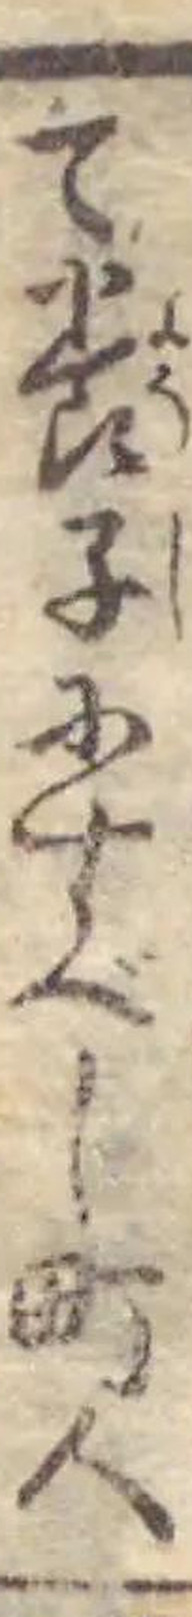て養子にすべし町人
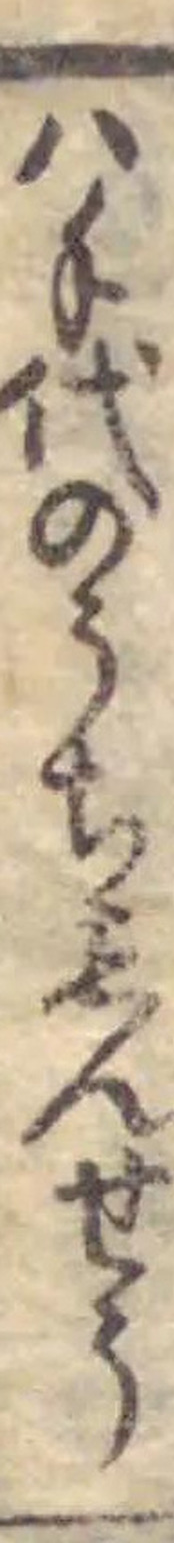は手代のうちしんせう

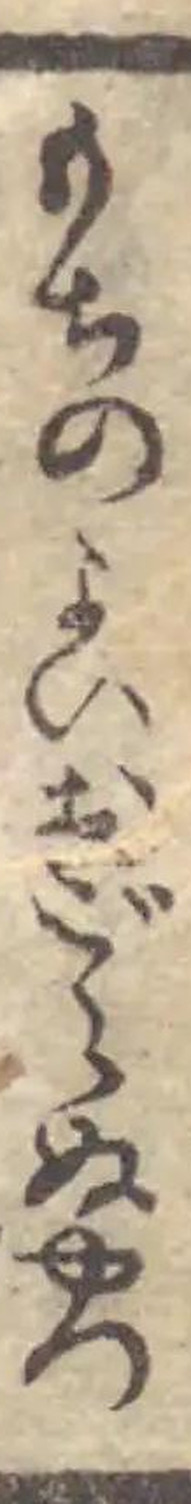もちのよいおごらぬやつ
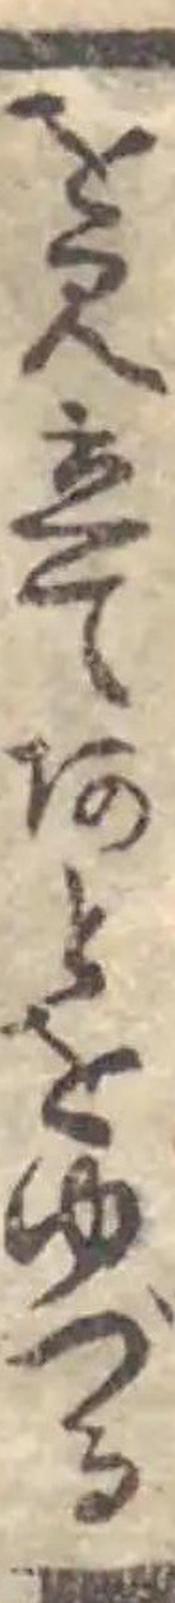を見立てあとをゆづる
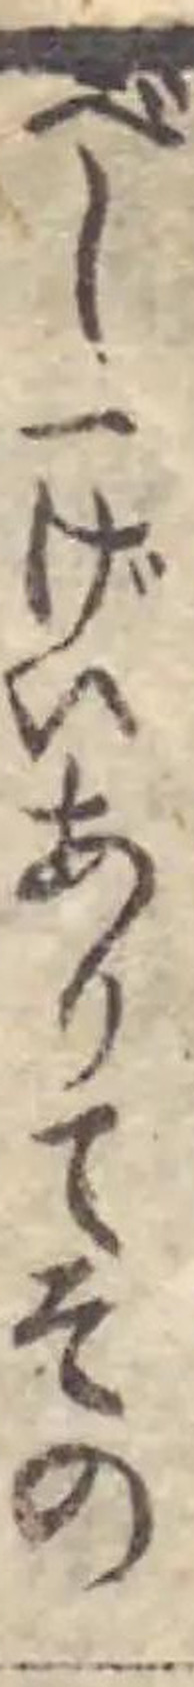べし一げいありてその
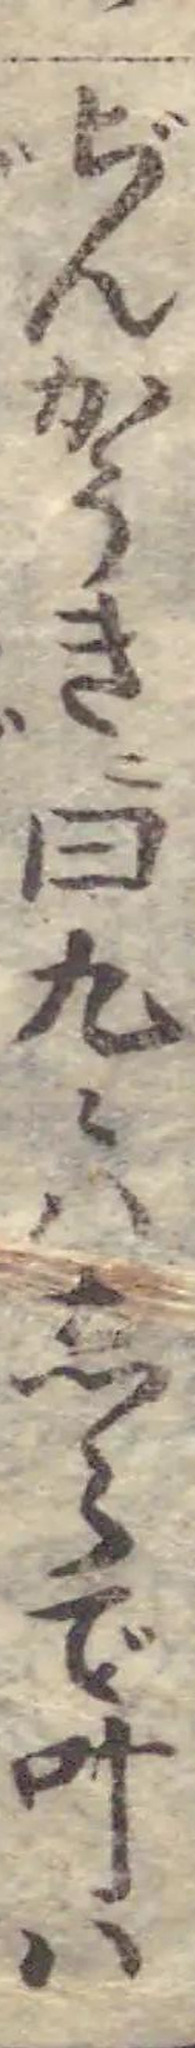ぢんかうきに曰九々とはしらで叶は
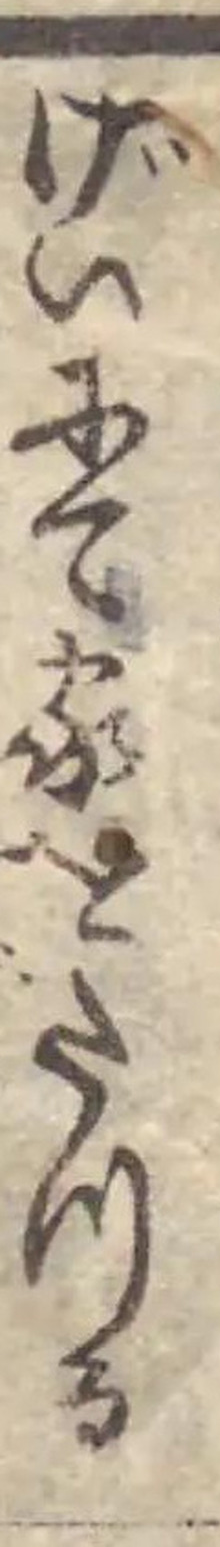げいにて家をたつる
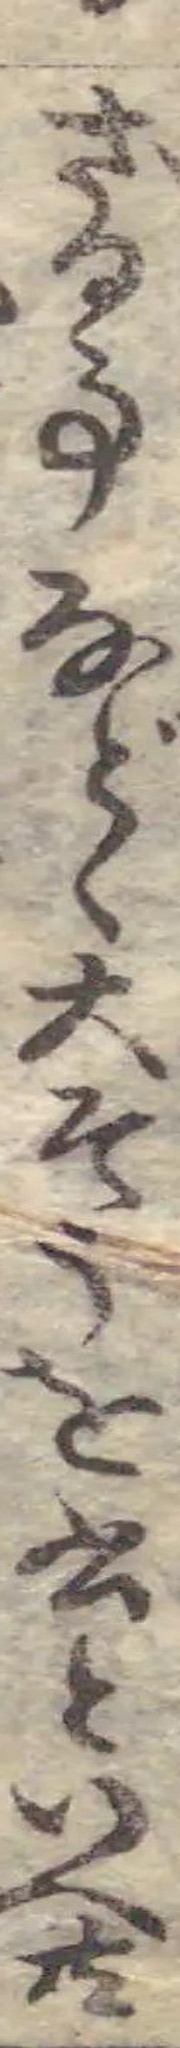ざる事などゝ体そうを書といへ共
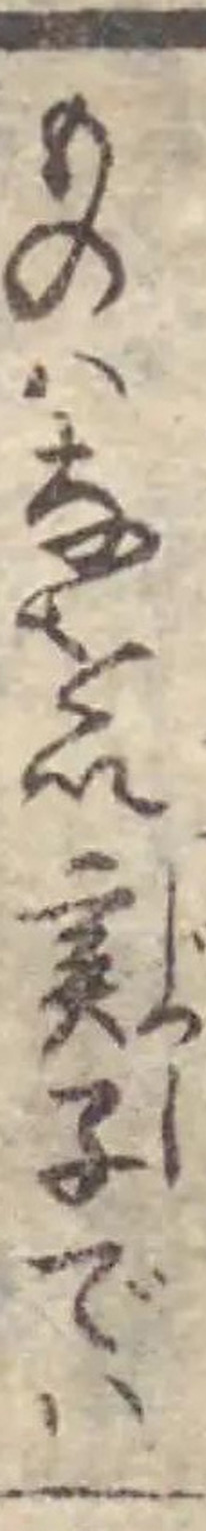ものはなを以実子では
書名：大通人好記
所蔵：国立国会図書館 National Diet Library, JAPAN
